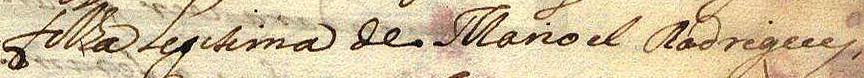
filha Legitima de Manoel Rodrigues,
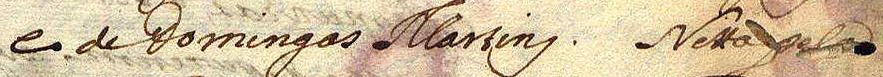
e de Domingas Martins. Netta pela
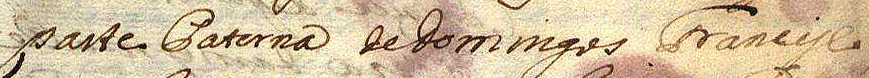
parte Paterna de Domingos Francisco,
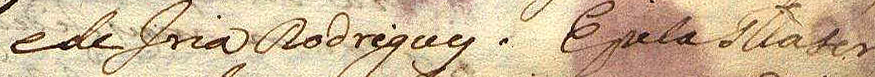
e de Jria Rodrigues. E pela Mater
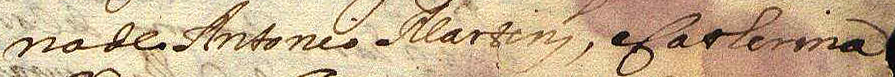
na de Antonio Martins, e Catherina
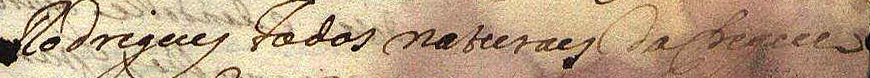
Rodrigues todos naturaes da fregue
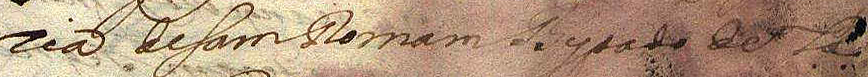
zia de sam Romam Bispado de La
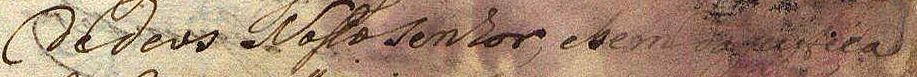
de deos Nosso senhor, e bem da justiça
